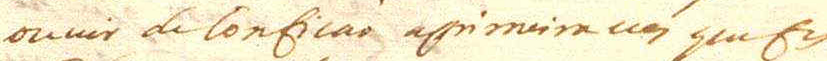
ouuir de Confiçaõ a primeira uez que fez
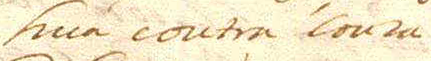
huā e outra couza.
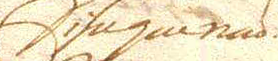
Disse que naõ.
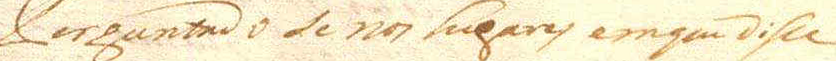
Perguntado se nos lugares em que disse
